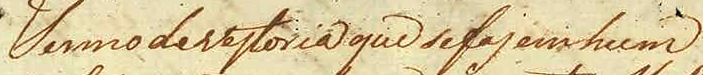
Termo de Vistoria que se fas em hum
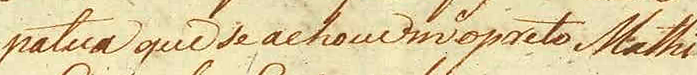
patua que se achou em o preto Mathi
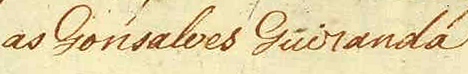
as Gonsalves Guizanda
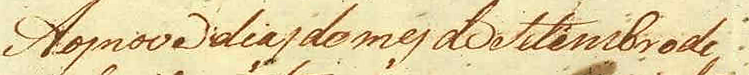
Aos nove dias do mes de Setembro de
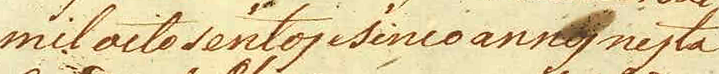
mil oitosentos e sinco annos nesta
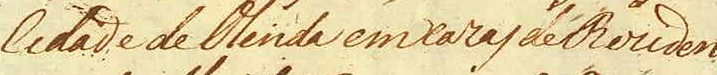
Cidade de Olinda em cazas de Reziden
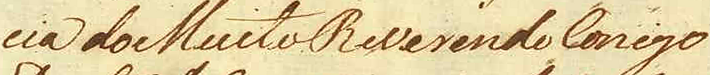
cia do Muito Reverendo Conigo
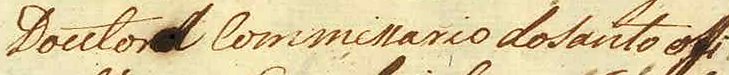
Doutor _ Commissario do Santo offi
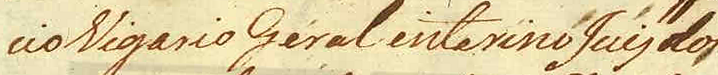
cio Vigario Geral interino Juis dos
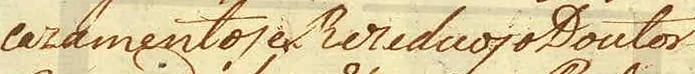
cazamentos e Rezeduos o Doutor
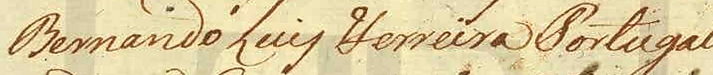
Bernando Luis Ferreira Portugal
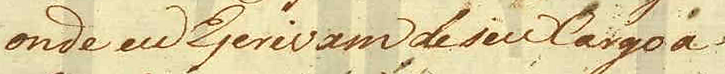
onde eu Escrivam de seu Cargo a
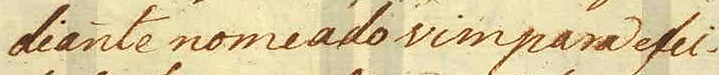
diante nomeado vim para efei
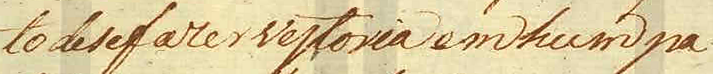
to de se fazer vestoria em hum pa
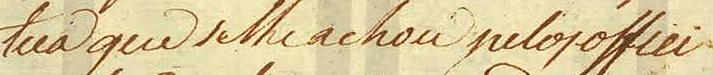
tua que se lhe achou pelos offici
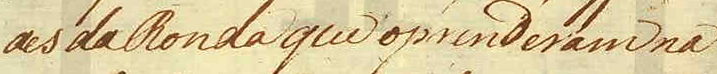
aes da Ronda que o prenderam na
